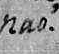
naõ.
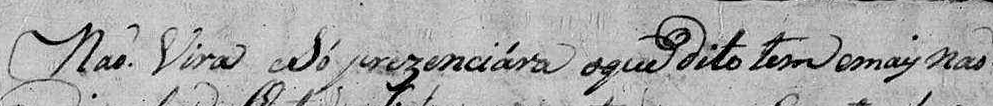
Naõ. Vira e Só prezenciára o que dito tem e mais naõ.
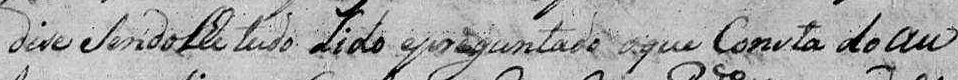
dise sendolhe tudo Lido e preguntado o que Consta do au
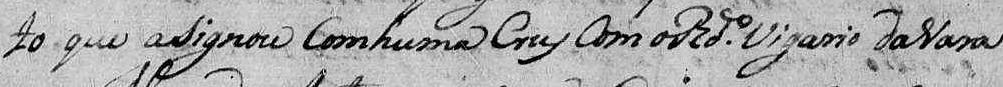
to que asignou Com huma Crus Com o Rd.o Vigario da Vara
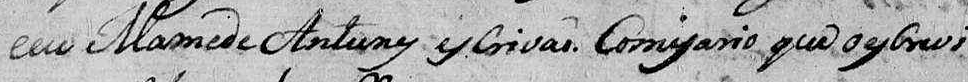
e eu Mamede Antunes esCrivaõ. Comisario que o esCrevi.
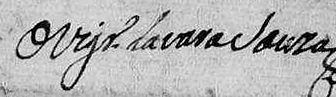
O Vigr.o da vara Souza
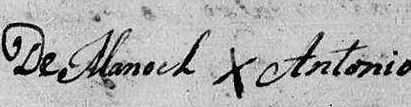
De Manoel x Antonio
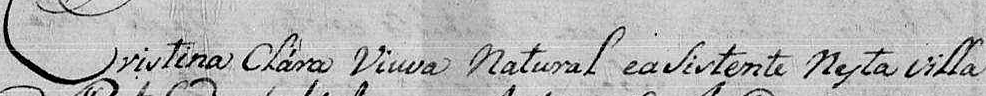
Cristina Clara Viuva natural e asistente nesta villa
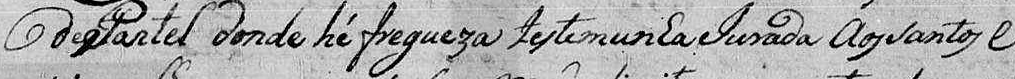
de Partel donde hé fregueza testemunha Iurada Aos santos e
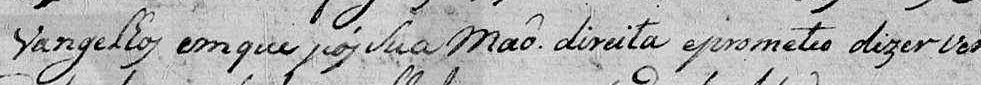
vangelhos em que pós sua maõ. direita e prometeo dizer ver
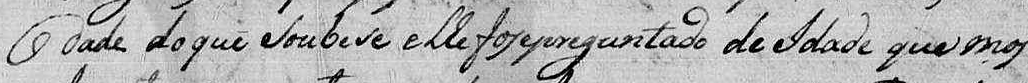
dade do que soubese e lhe fose preguntado de Idade que mos
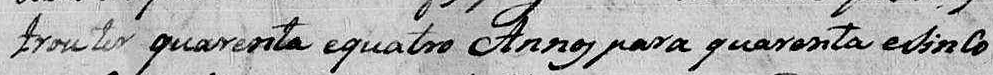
trou ter quarenta e quatro Annos para quarenta e sinCo
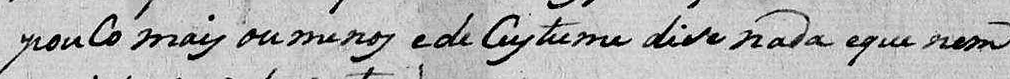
pouCo mais ou menos e de Custume dise nada e que nem
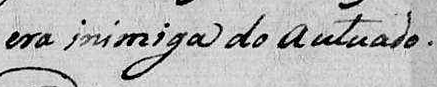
era inimiga do autuado.
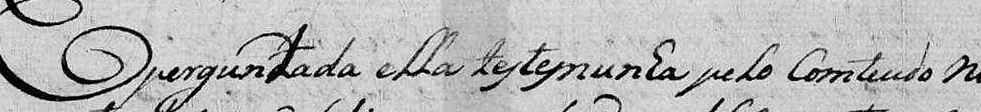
E perguntada ella testemunha pelo Comteudo no
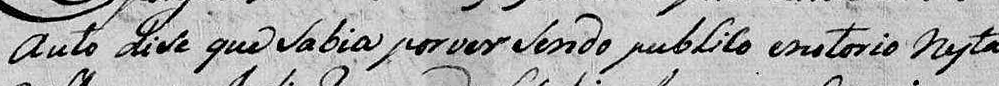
auto dise que sabia por ver sendo publiCo e notorio nesta
